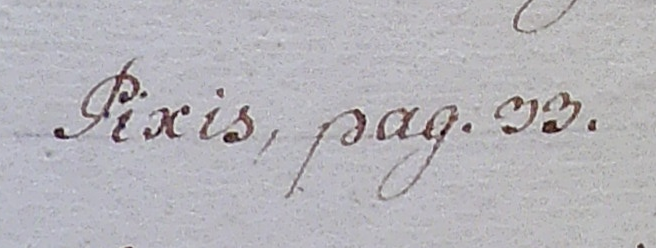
Pixis, pag. 33.
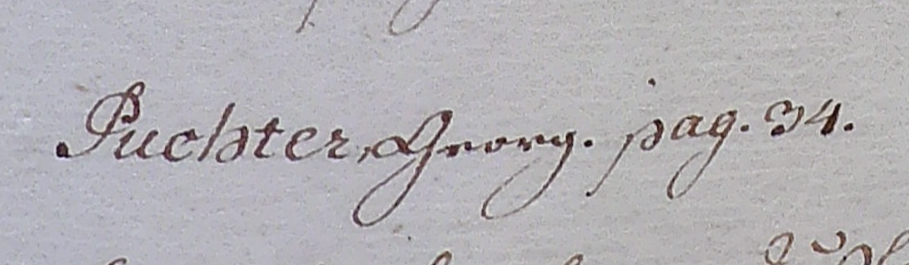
Puchter, Georg. pag. 34.
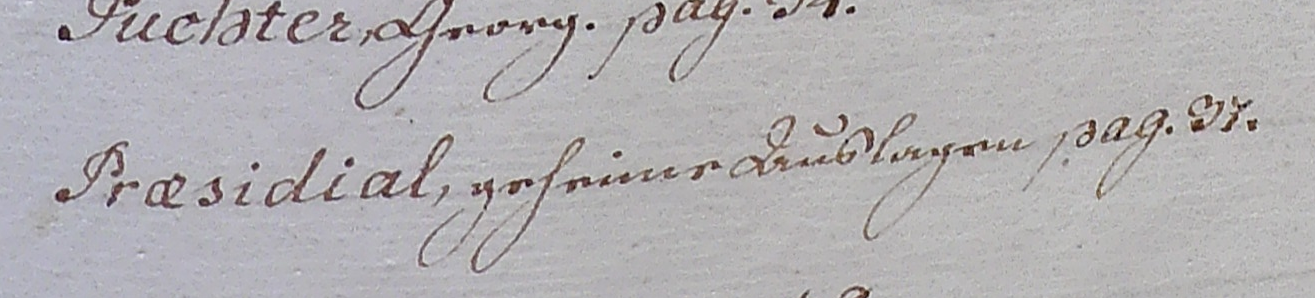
Præsidial, geheime Auslagen pag. 37.
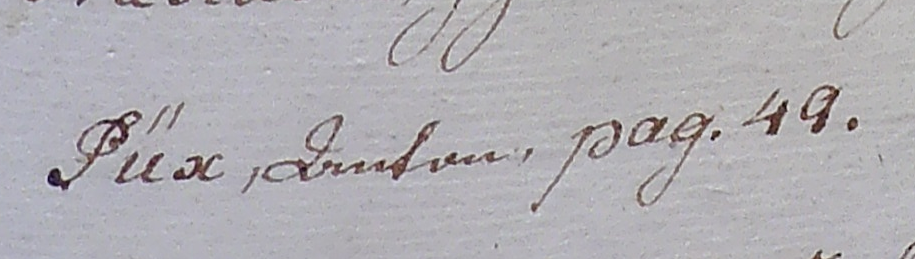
Püx, Anton, pag. 49.
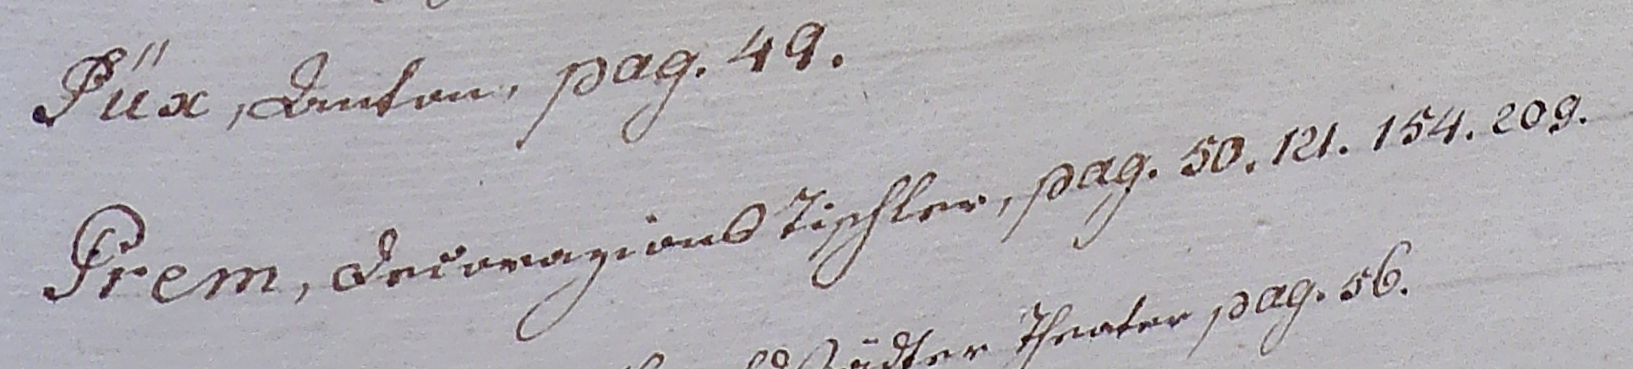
Prem, Decorazions Tischler, pag. 50. 121. 154. 200.
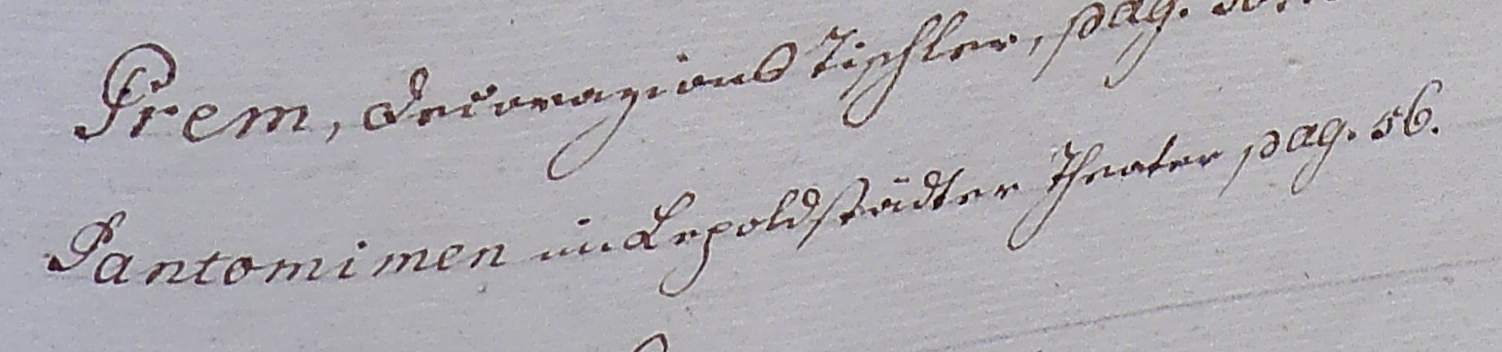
Pantomimen im Leopoldstädter Theater pag. 56.
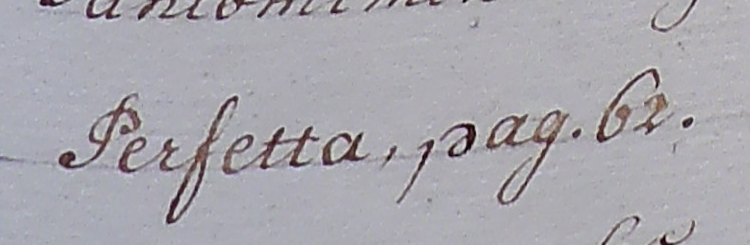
Perfetta, pag. 62.
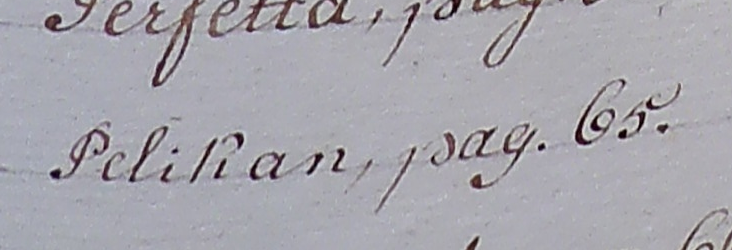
Pelikan, pag. 65.
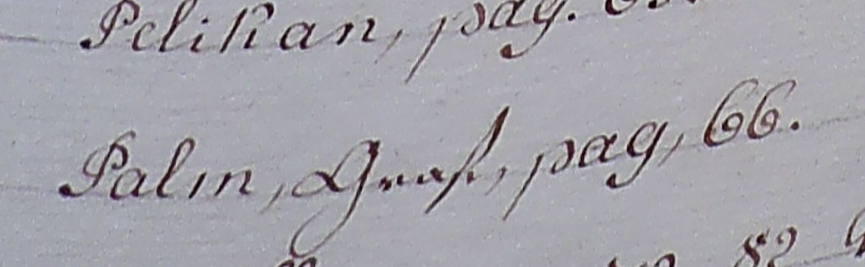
Palm, Graf, pag, 66.
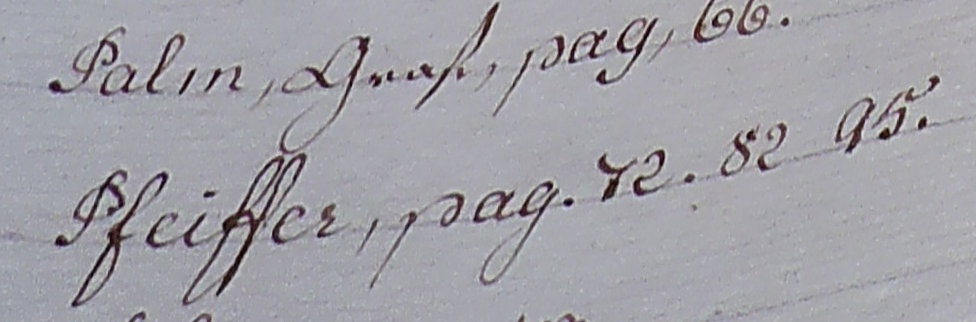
Pfeiffer, pag. 72. 82. 95.
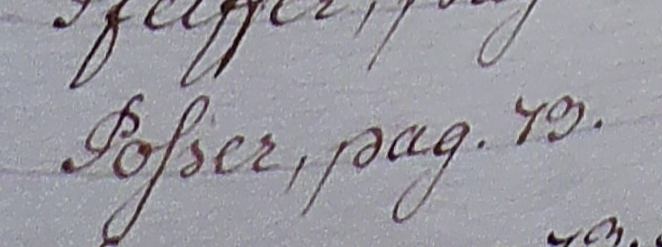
Posser, pag. 73.
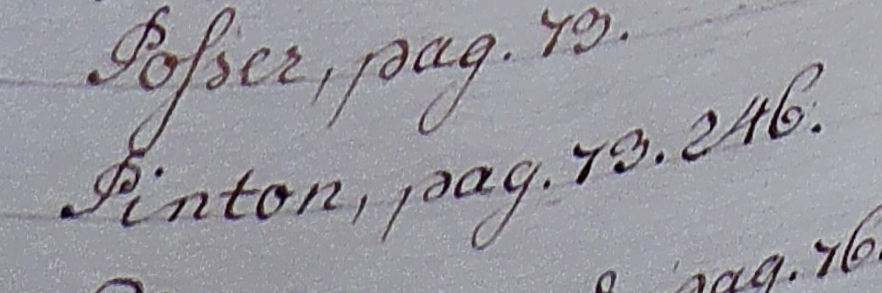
Pinton, pag. 73. 246.
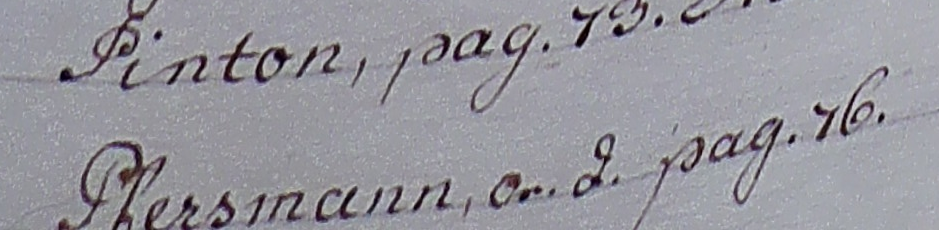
Pfersmann, oe. d. pag. 76.
